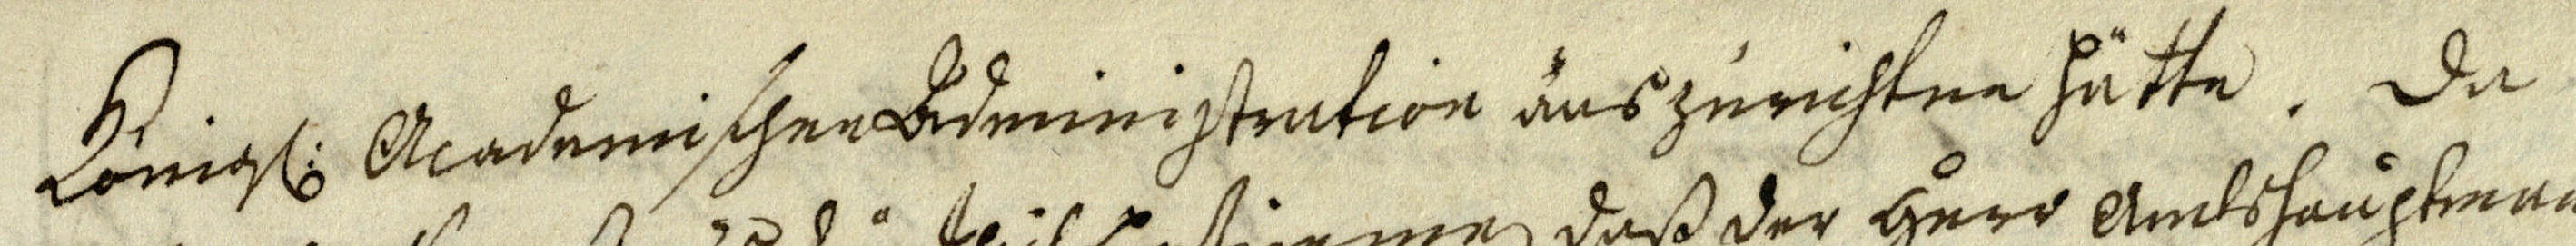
Königl. Academischen Administration auszurichten hätte. Da
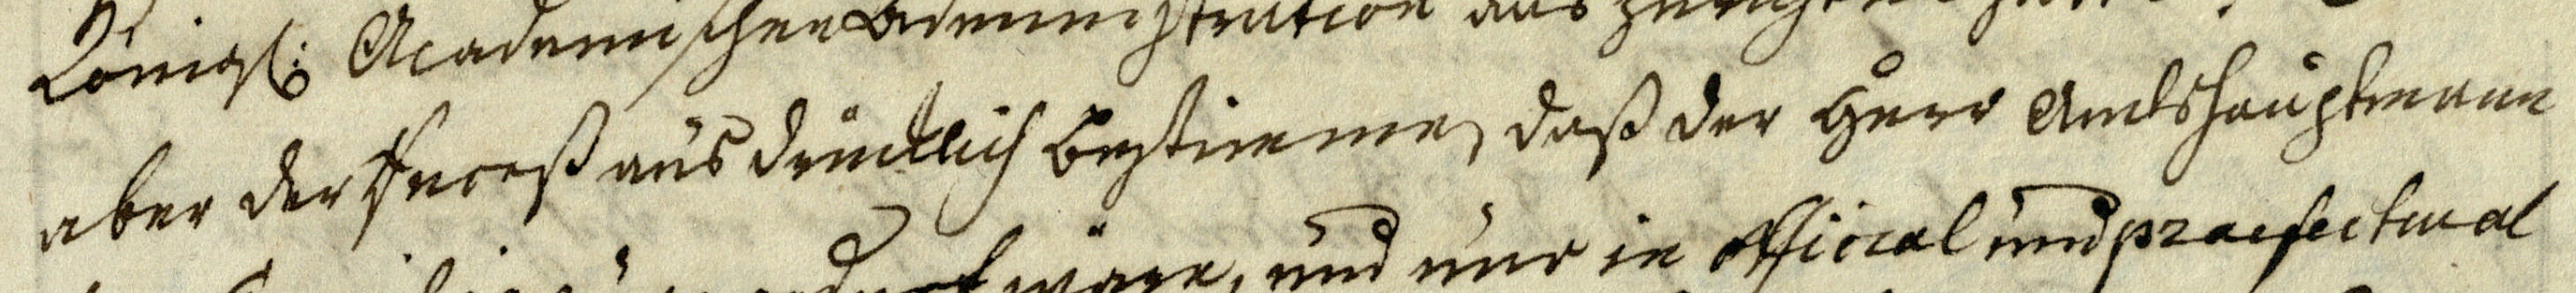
aber der Receß ausdrücklich bestimme, daß der Herr Amtshauptmann
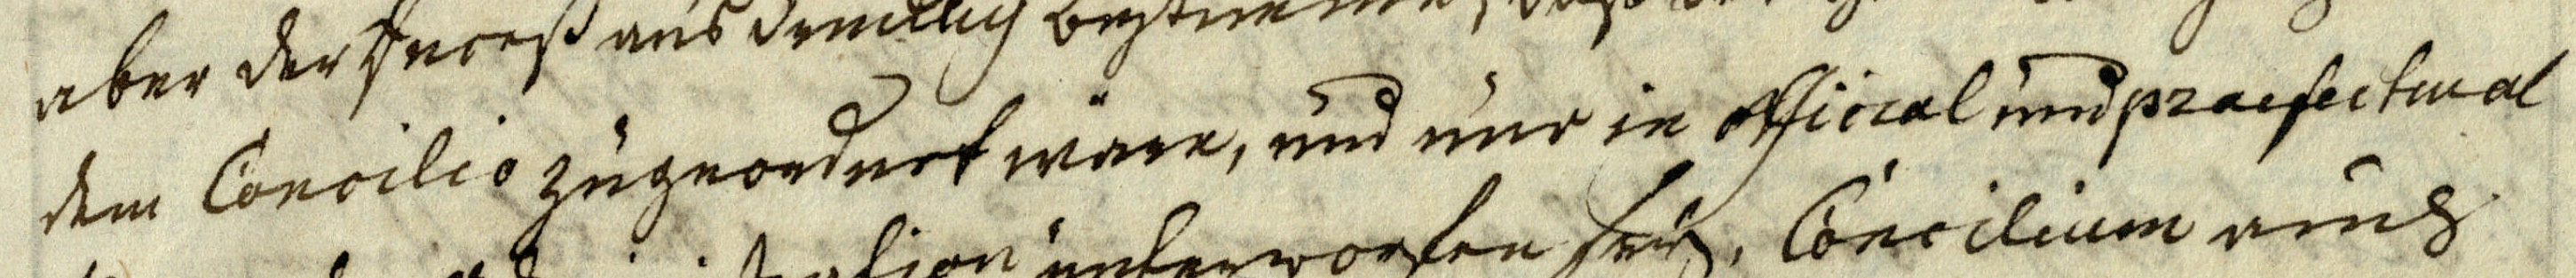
dem Concilio zugeordnet wäre, und nur in official und praefectural
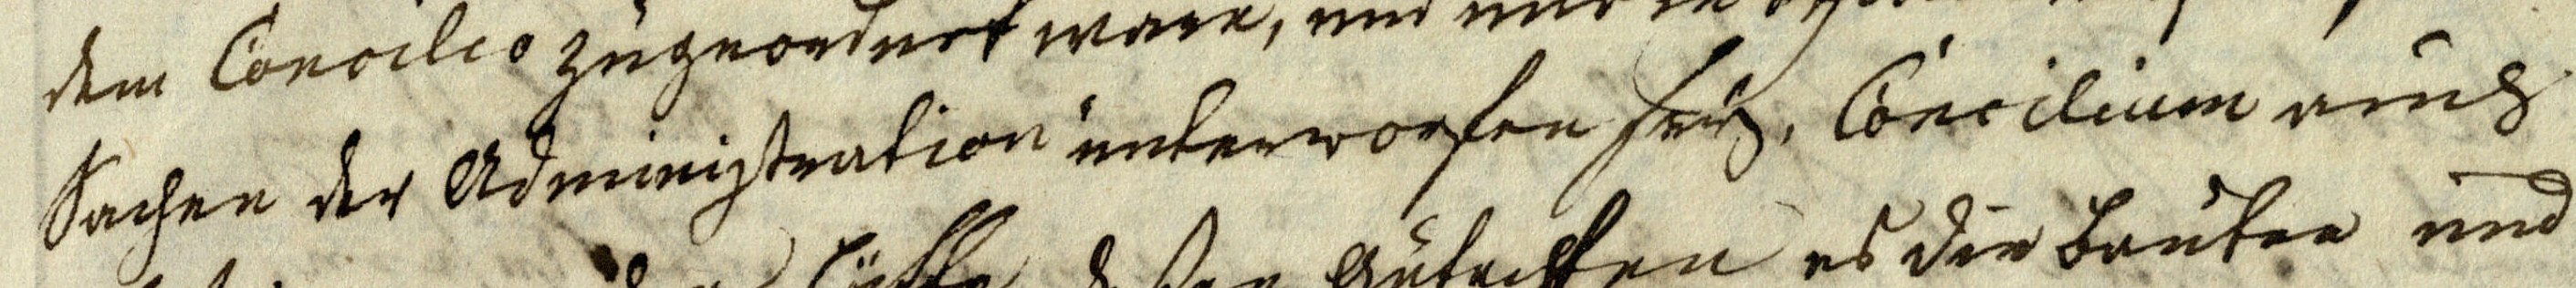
Sachen der Administration unterworfen seÿ, Concilium auch
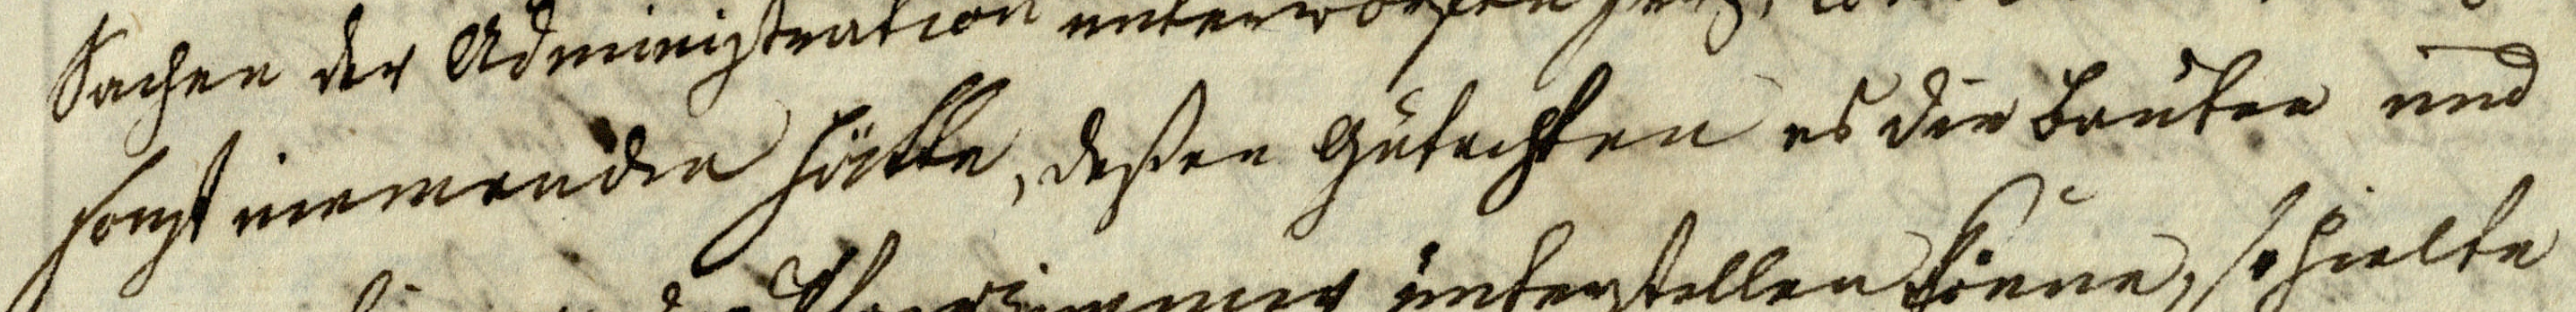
sonst niemanden hätte, deßen Gutachten es die Bauten und
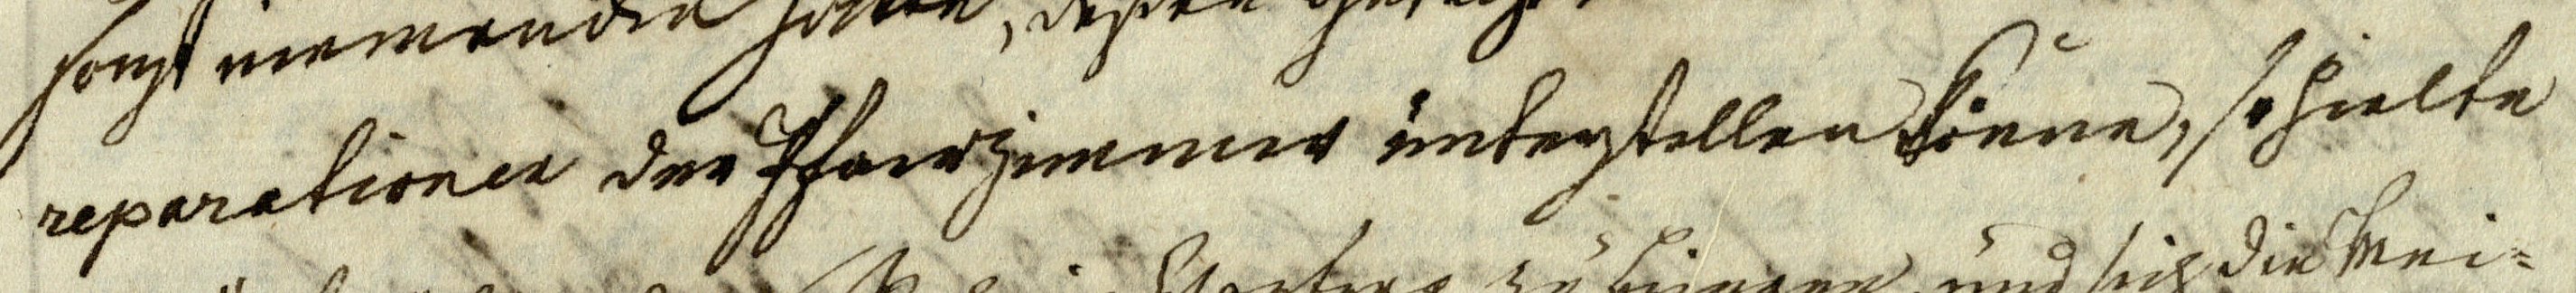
reparationen der Pfarrzimmer unterstellen könne, so hielte
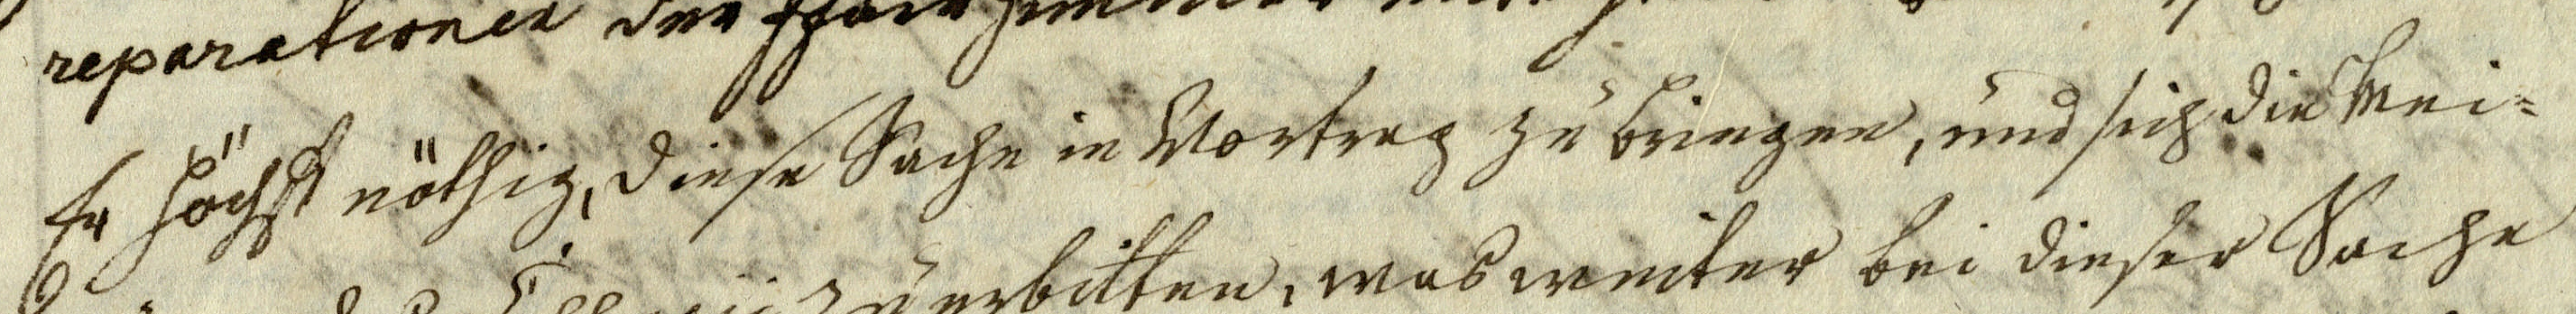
Er höchst nöthig, diese Sache in Vortrag zu bringen, und sich die Mei¬
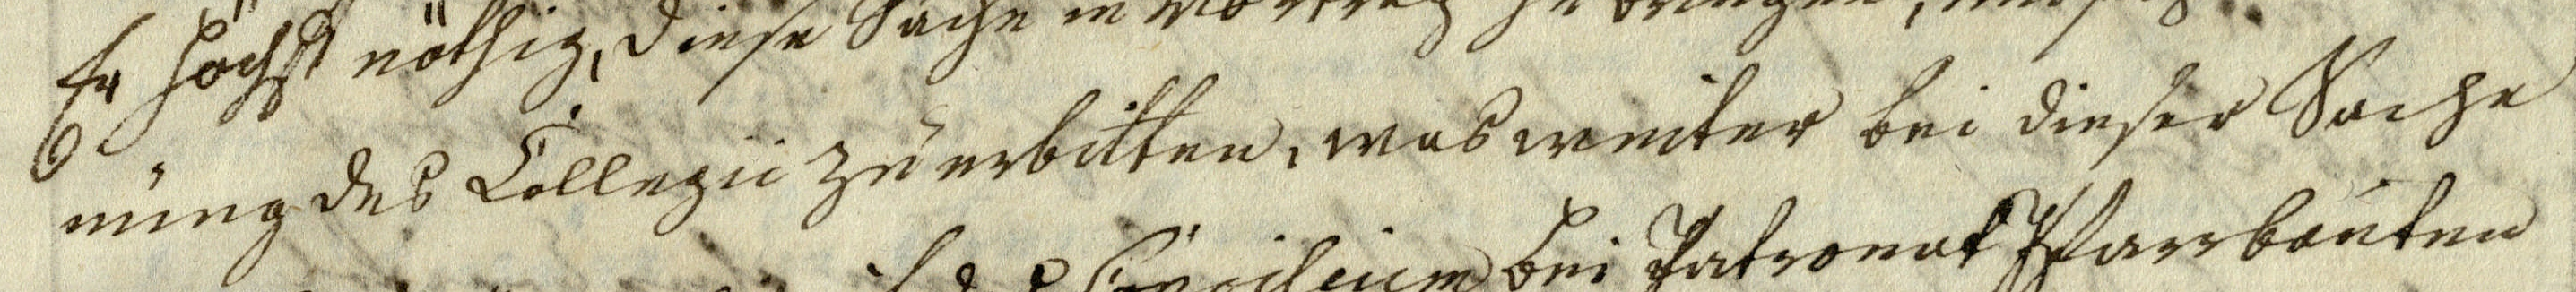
nung des Collegii zu erbitten, was weiter bei dieser Sache
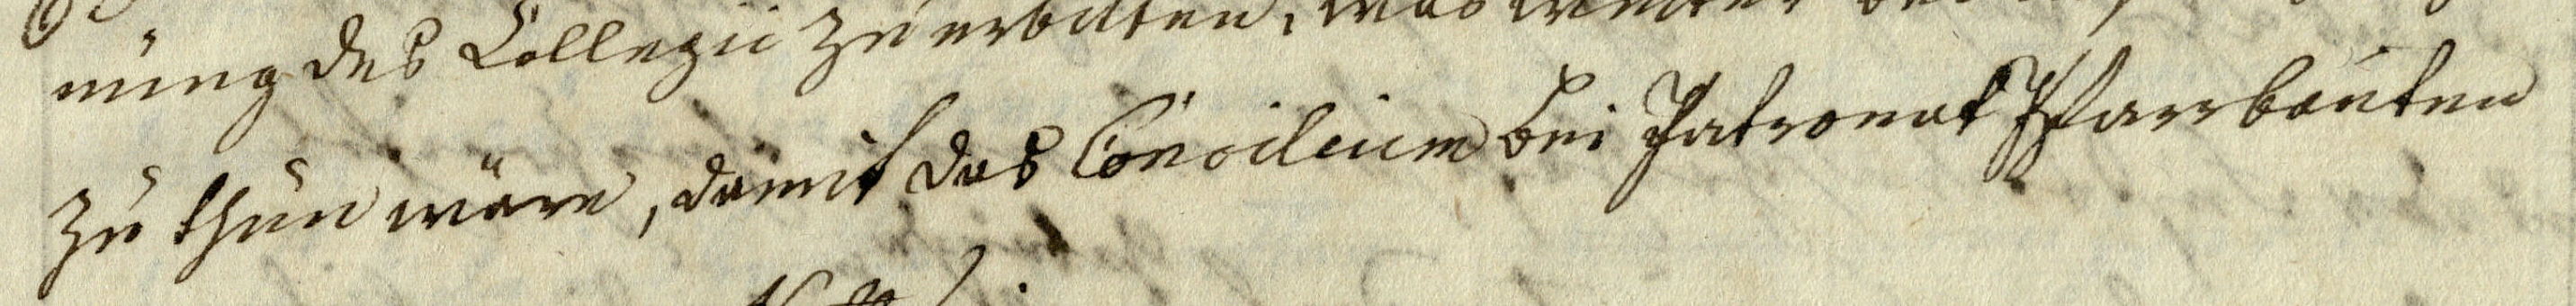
zu thun wäre, damit das Concilium bei Patronat Pfarrbauten
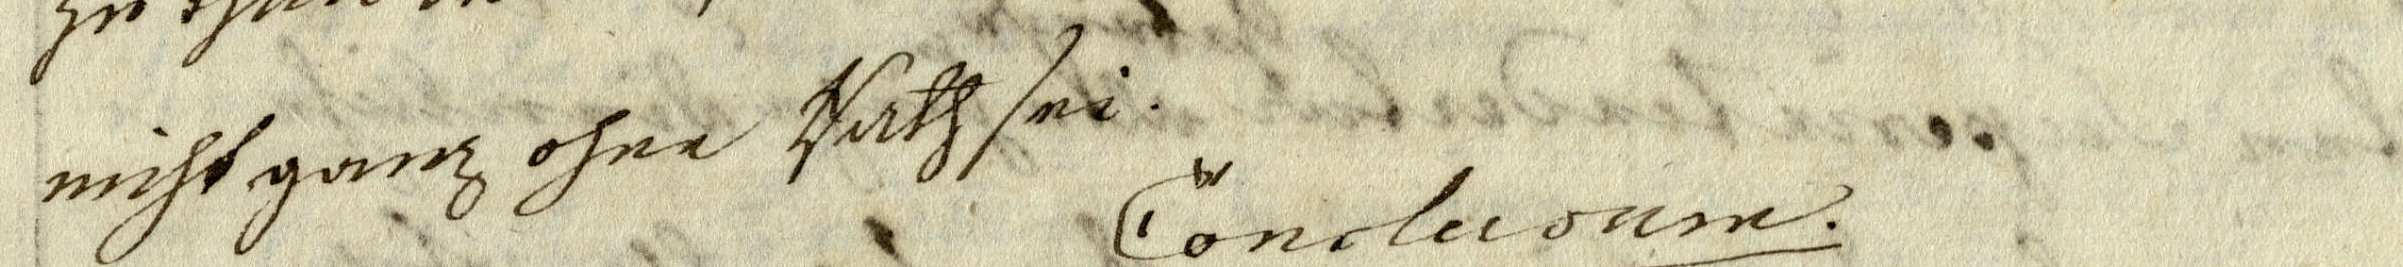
nicht ganz ohne Rath sei.
